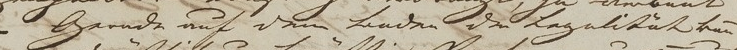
– Gerade auf dem Boden der Legalität kann
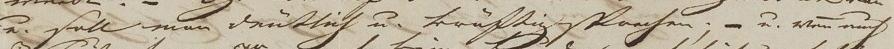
u. soll man deutlich u. kräftig sprechen; – u. wenn auch
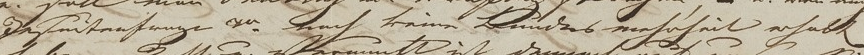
Jesuitenfrage &ca noch keine Bundesmehrheit erhalten
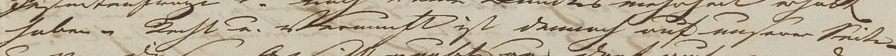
haben – Recht u. Vernunft ist dennoch auf unserer Seite –
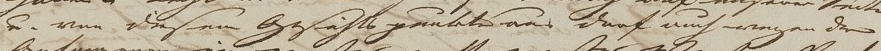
u. von diesem Gesichtspunkte aus darf auch wegen der
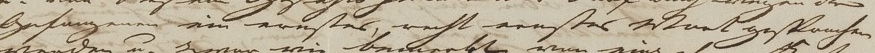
Gefangenen ein ernstes, recht ernstes Wort gesprochen
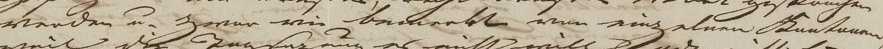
werden u. zwar wie bemerkt von einzelnen Kantonen,
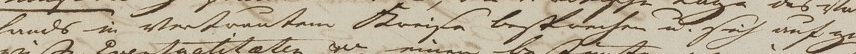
lands in vertrautem Kreise besprechen u. sich auf ge-
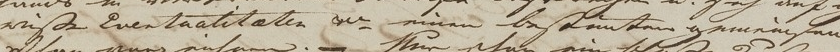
wiße Eventualitæten &ca einen bestimmten gemeinsamen
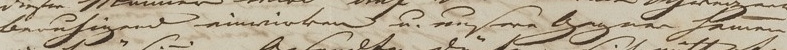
beruhigend einwirken u. unsere Gegner hemmen.
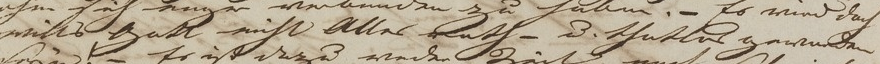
wills Gott nicht Alles rath- u. thatlos geworden
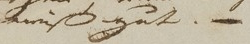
gewiß gut. –
